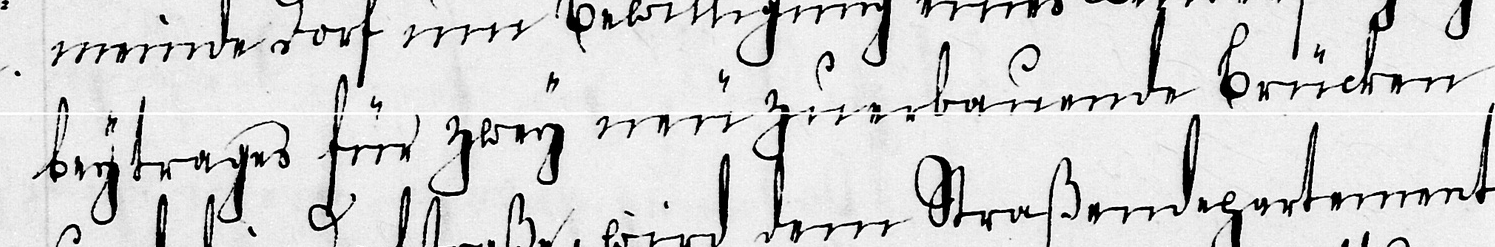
beytrages für zwey neuzuerbauende Brücken
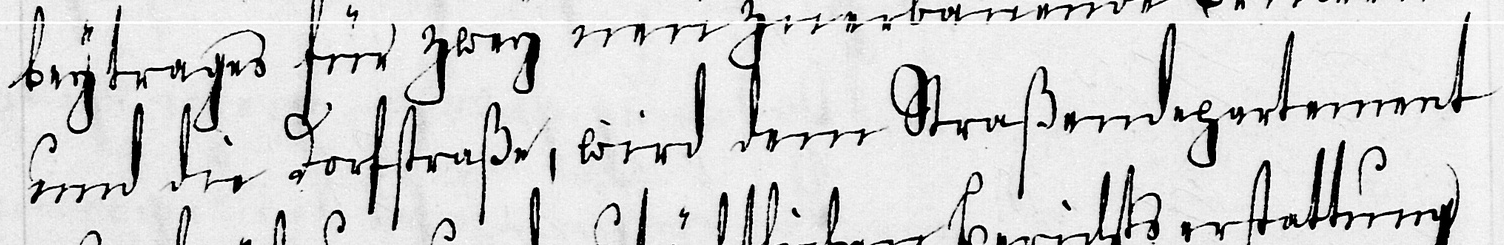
und die Dorfstraße, wird dem Straßendepartement
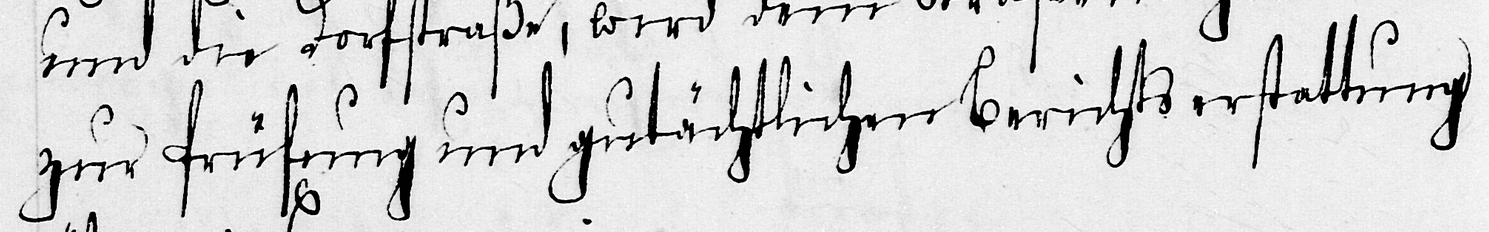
zur Prüfung und gutächtlichen Berichtserstattung
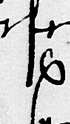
r¬
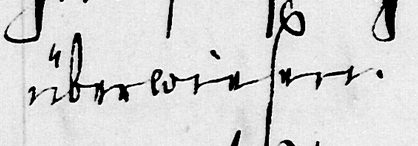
überwiesen.
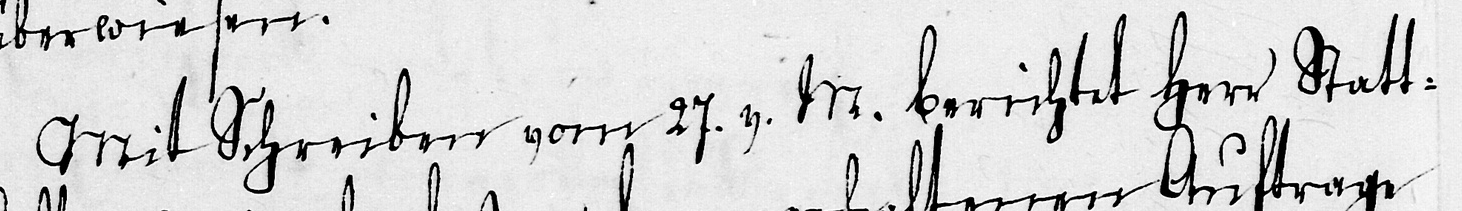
Mit Schreiben vom 27. v. M. berichtet Herr Statt¬
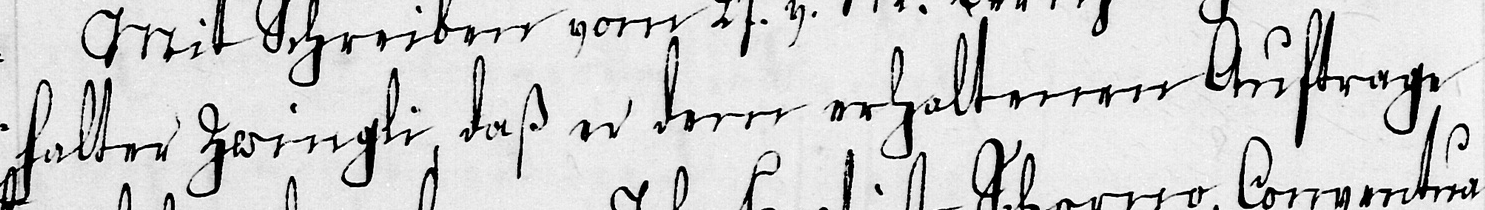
halter Zwingli, daß er dem erhaltenen Auftrage
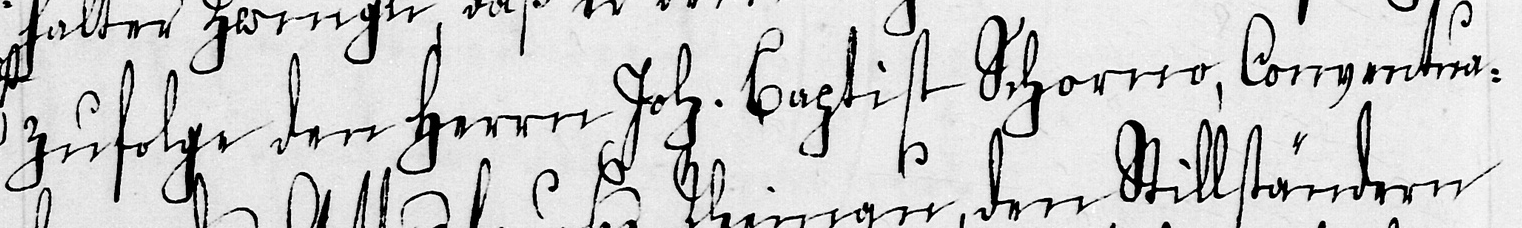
zufolge den Herrn Joh. Baptist Schorno, Conventua¬
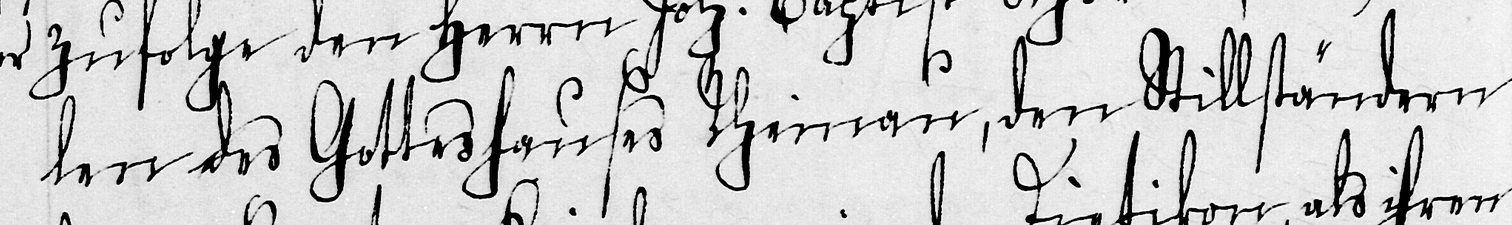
len des Gotteshauses Rheinau, den Stillständern
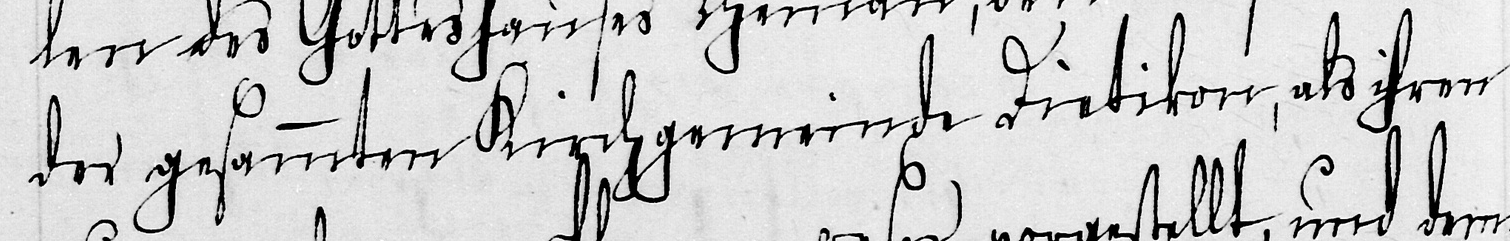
der gesammten Kirchgemeinde Dietikon, als ihren
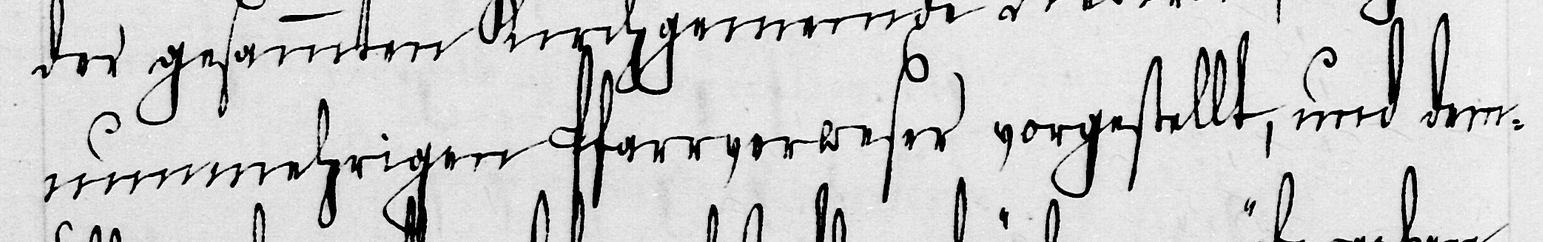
nunmehrigen Pfarrverweser vorgestellt, und dem¬
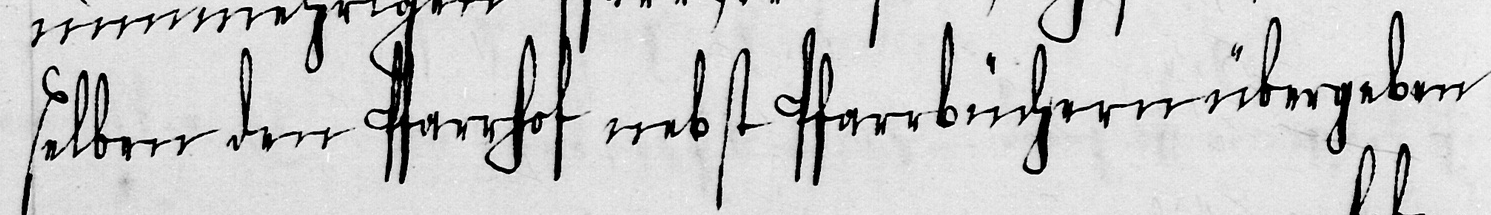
selben den Pfarrhof nebst Pfarrbüchern übergeben
